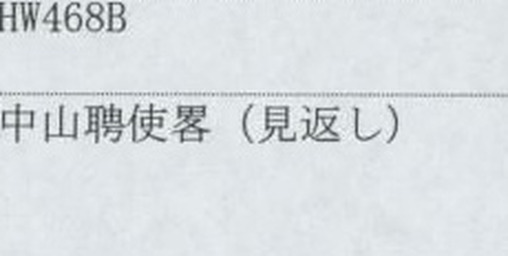中山聘使畧全
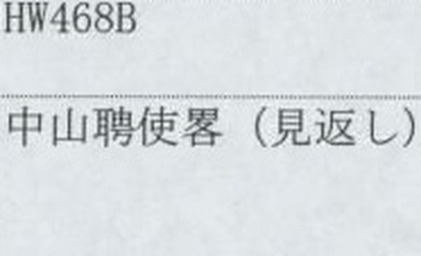中山聘使畧全
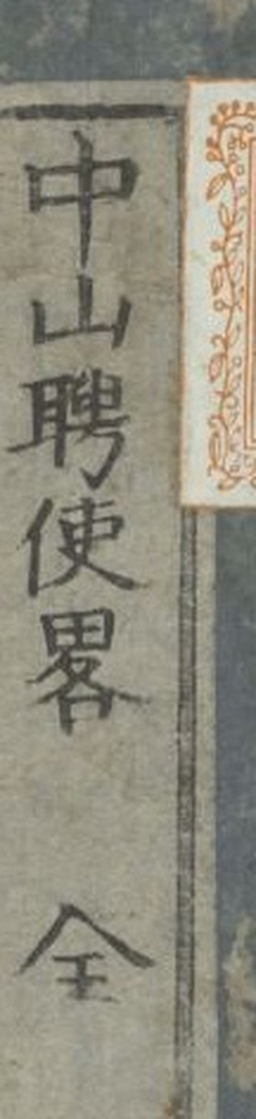中山聘使畧全
